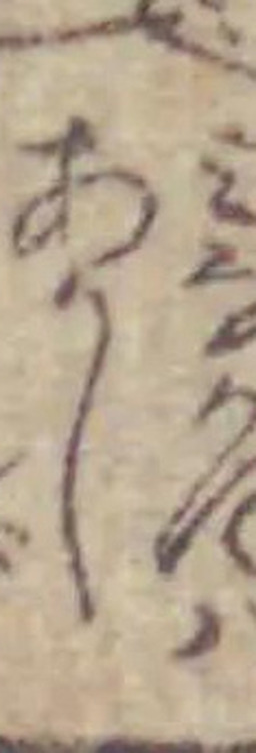あかし
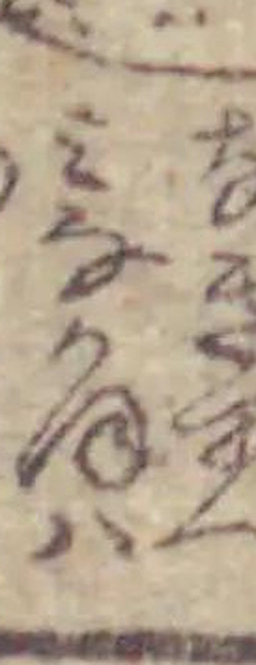みなかほは
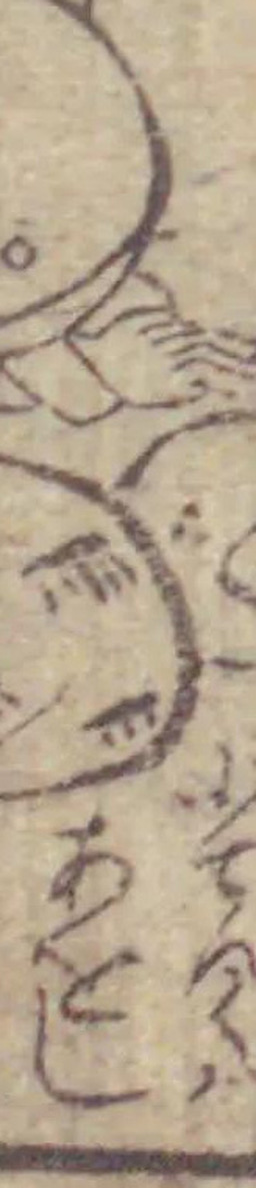あをし

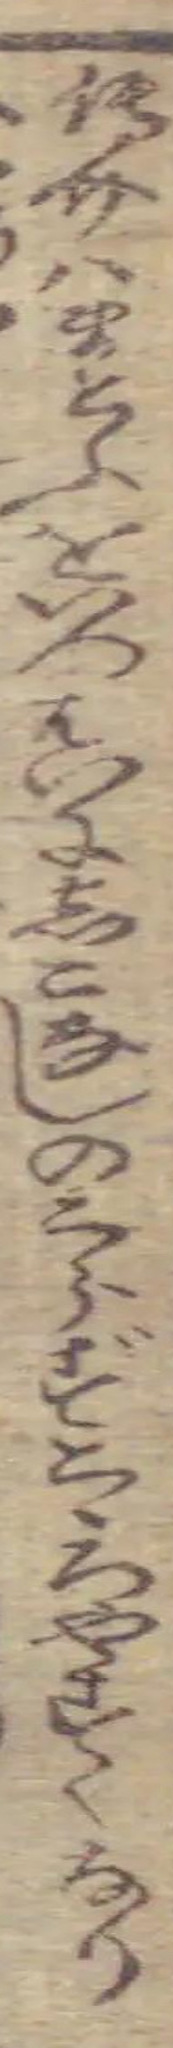伝介はまとふをいつはいにしこなしのこらずこゝろやすくなり
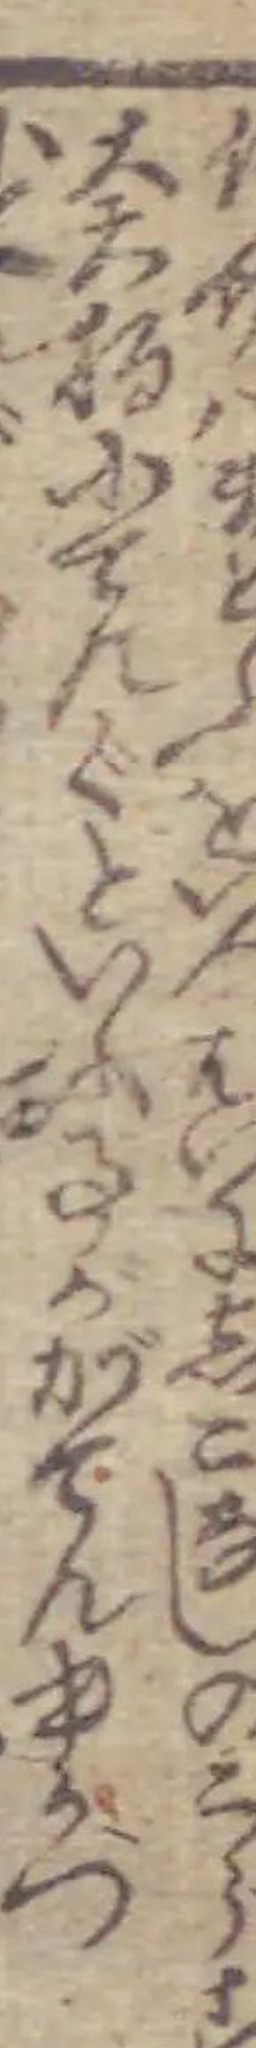大天狗小てんぐといふ事かがてんゆかづ
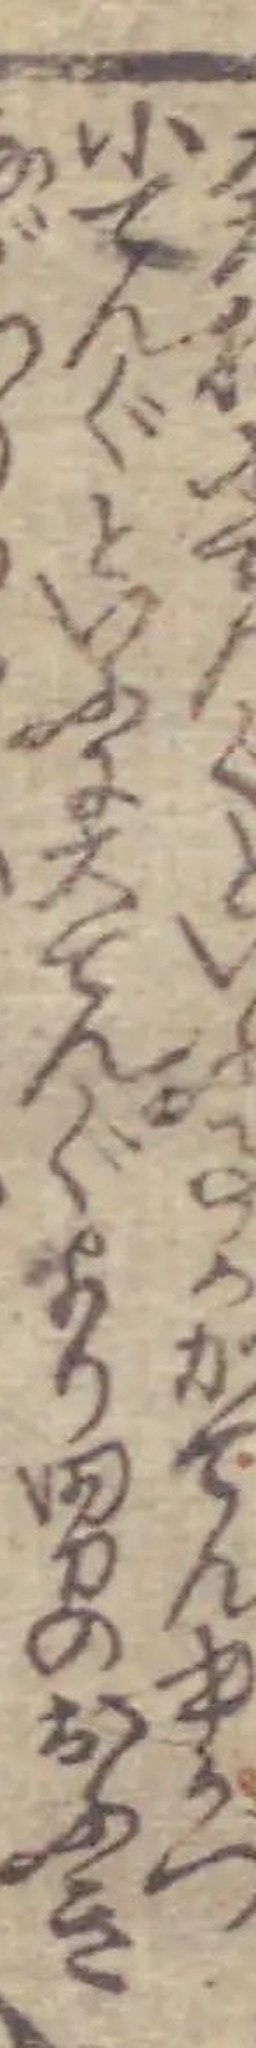小てんぐといふに大てんぐより男のおふき
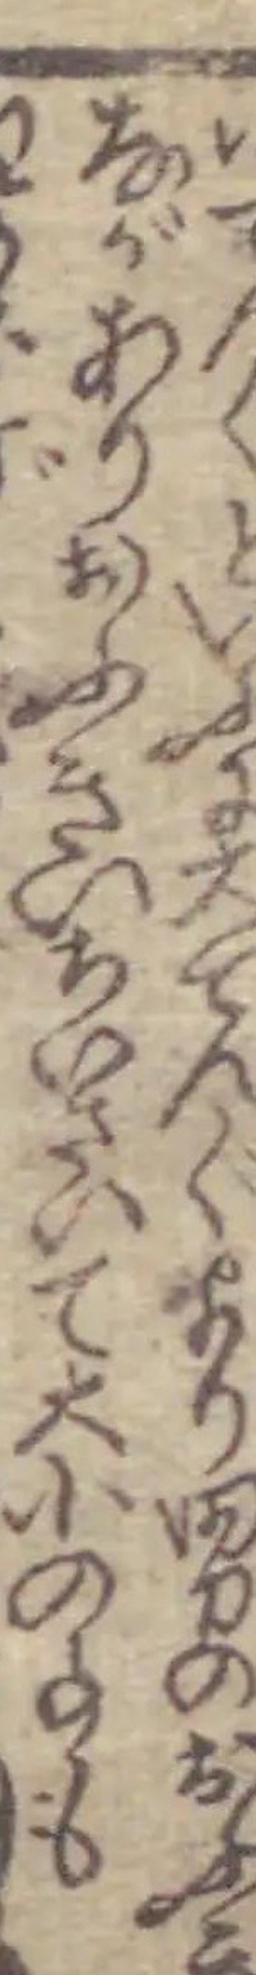ながありおふきいちいさいて大小の事も
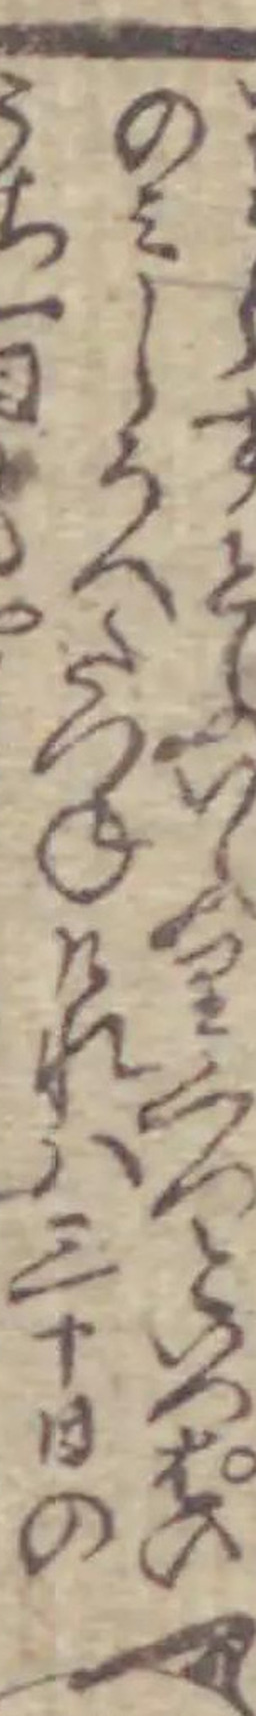のみしらへたつねけれは三十日の
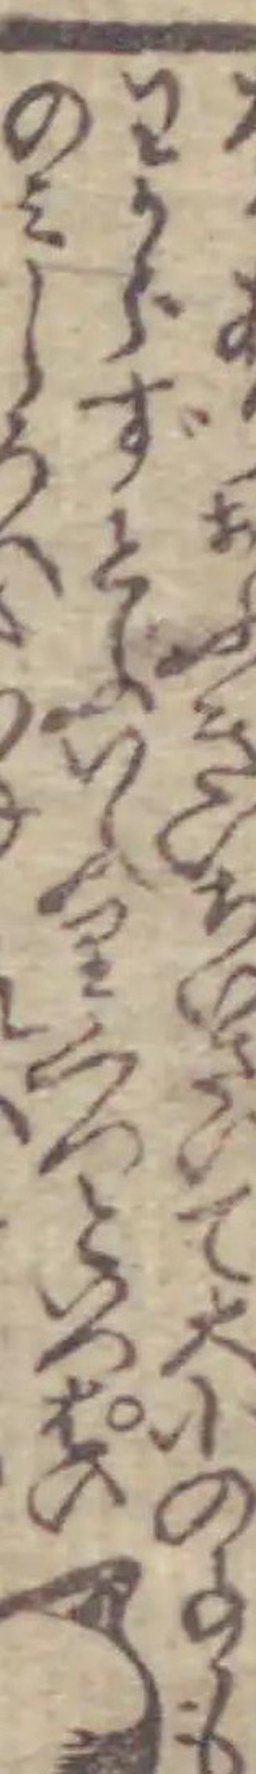わからずといふりくつといつぱい
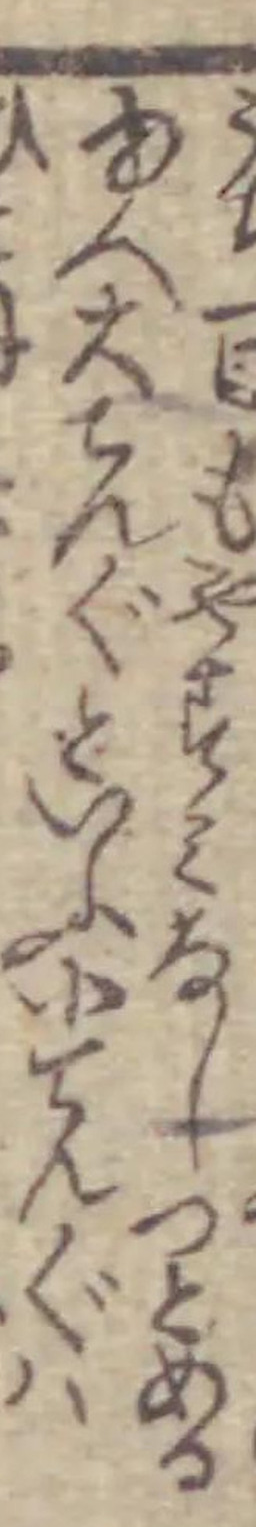ゆへ大てんぐといふ小てんぐは
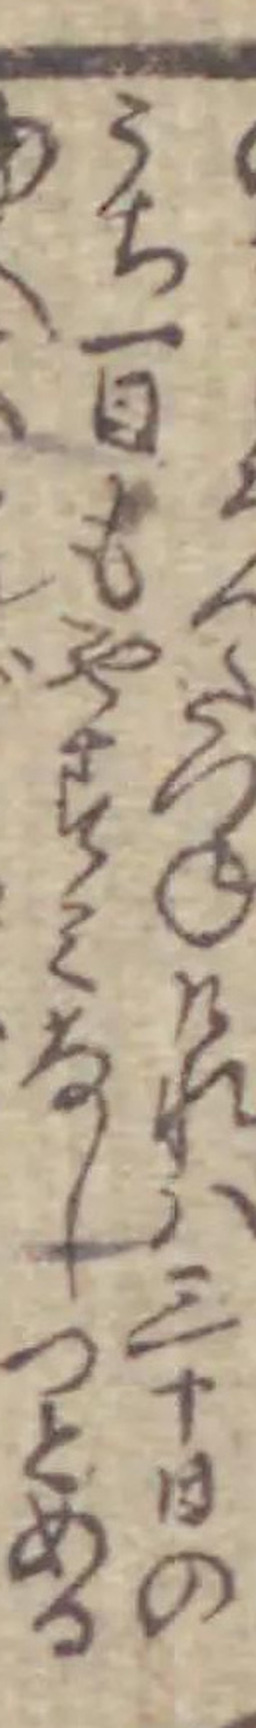うち一日もやすみなしつとめる
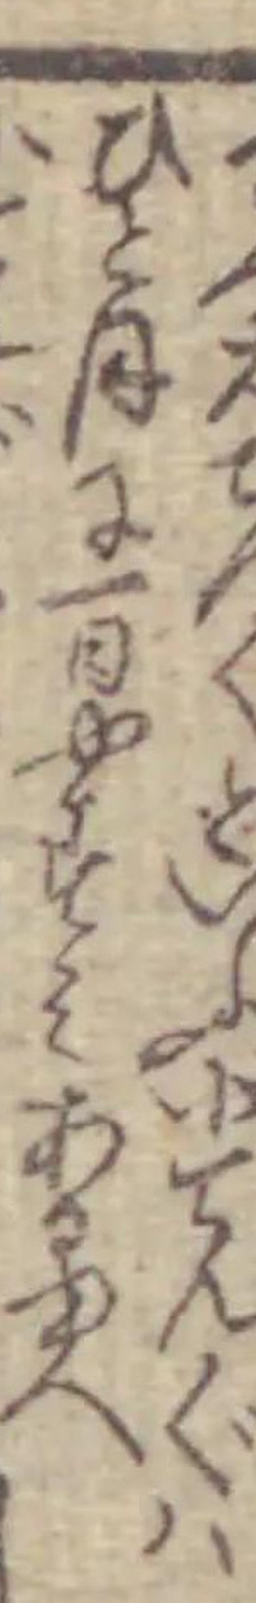ひと月に一日やすみあるゆへ
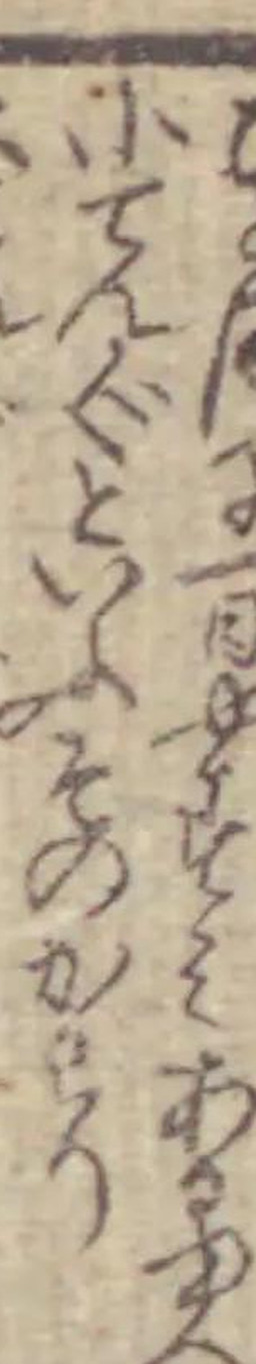小てんぐといふそのかわり
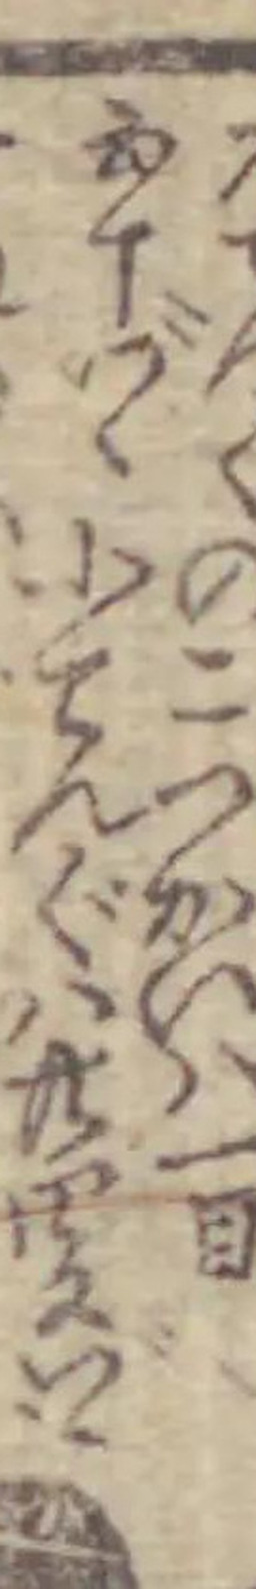五十づゝ小てんぐは廿四文づゝ
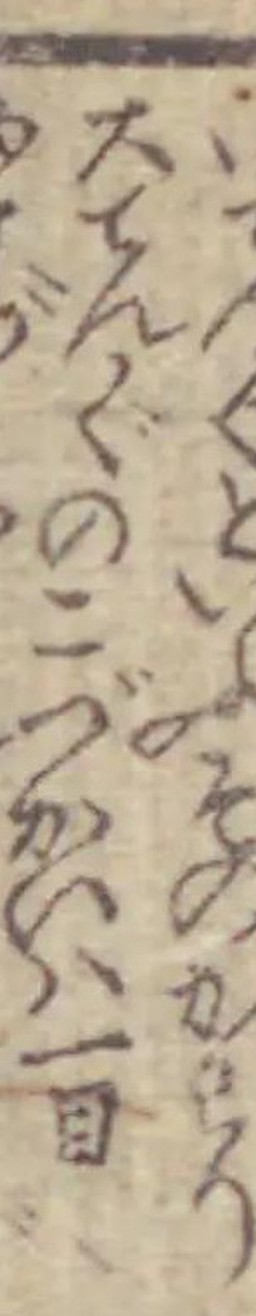大てんぐのこづかいは一日
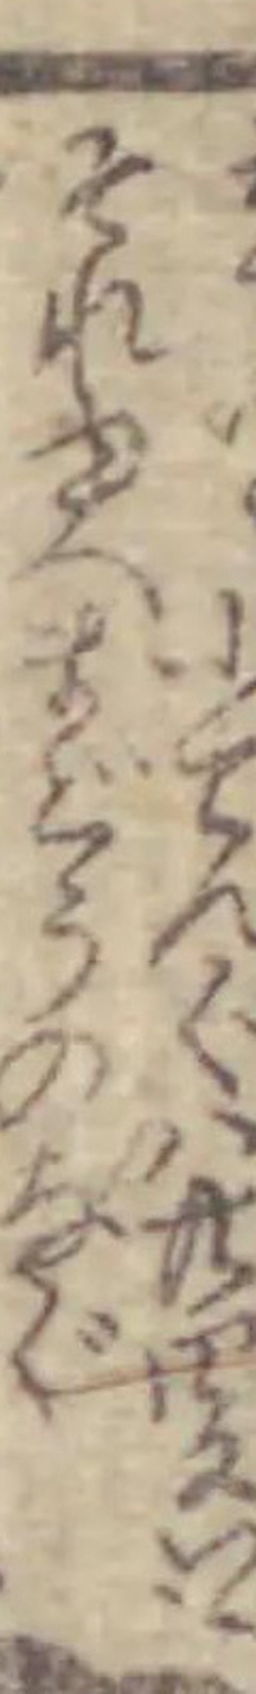それゆへまどうのなぐ
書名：珍説女天狗 2巻
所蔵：国立国会図書館 National Diet Library, JAPAN
